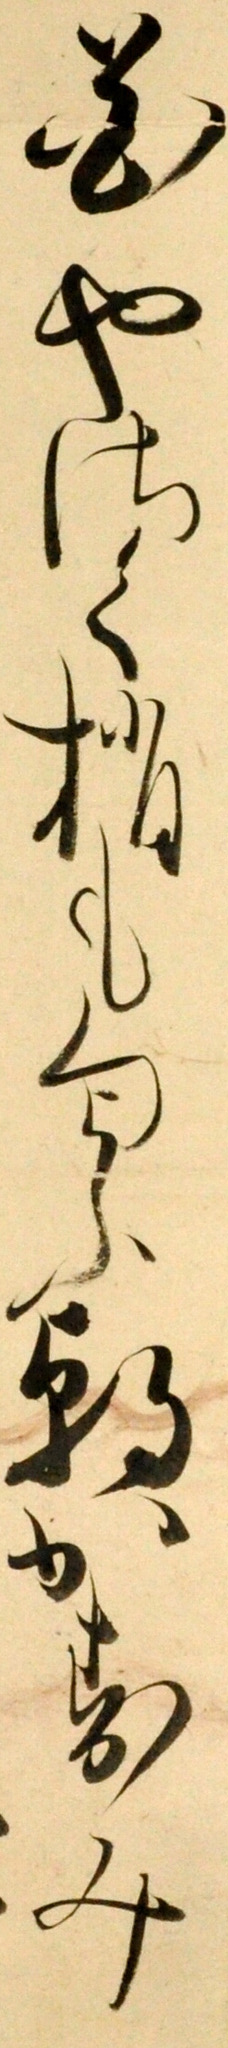花やさく梢も匂ふ朝かすみ
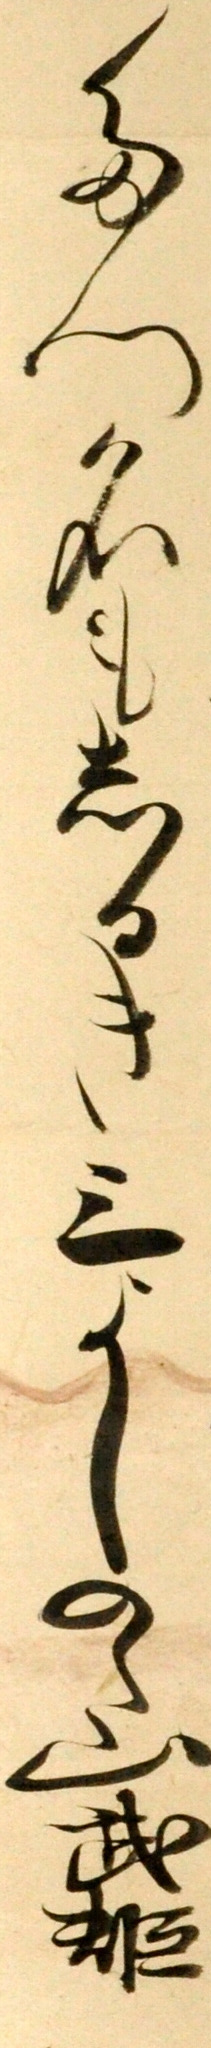たつ名もしるきみよしのゝ山武矩

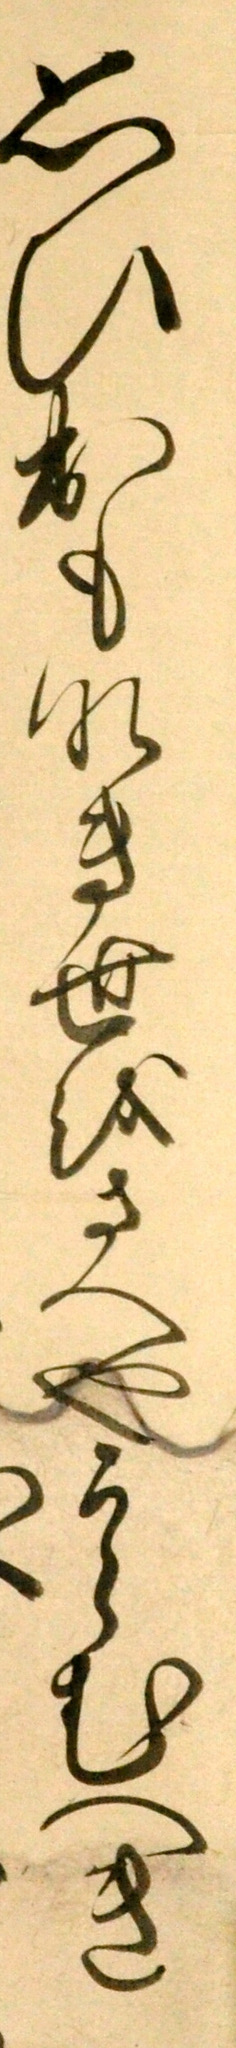思ひ出もなき世をさへやうらむへき
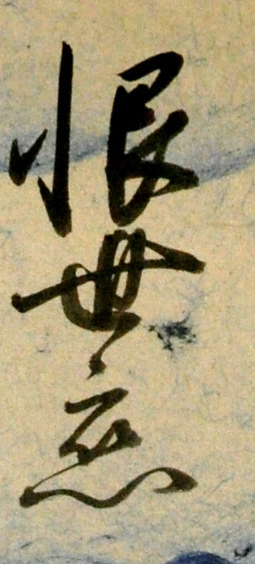恨世恋
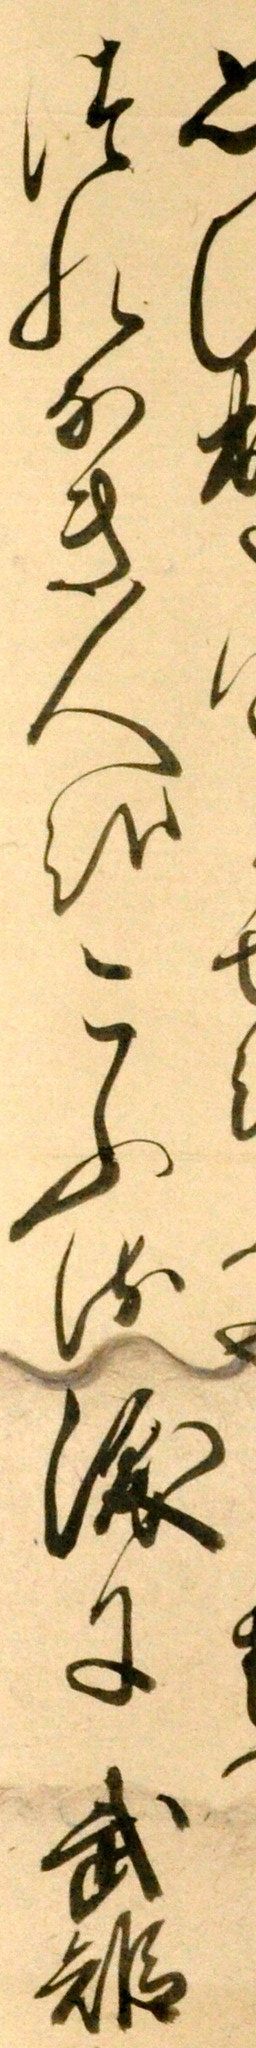つれなき人をこふる涙に武矩

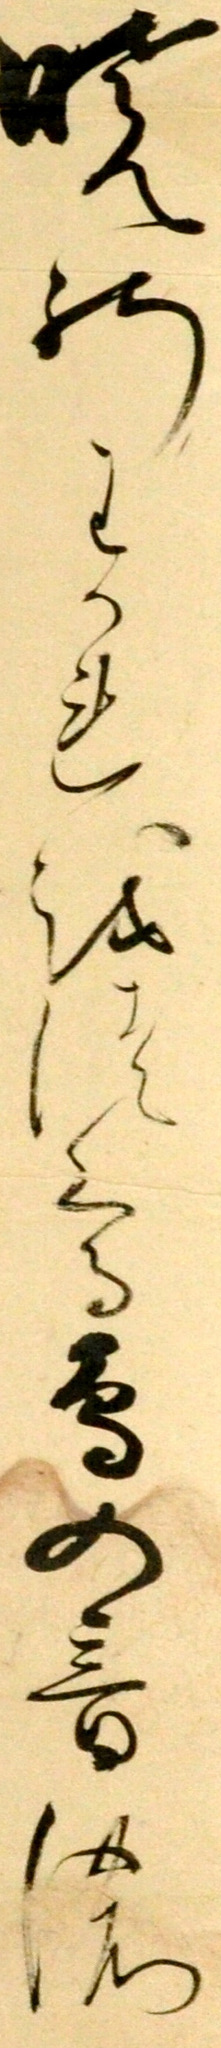暁のわかれをつくる鳥の音の
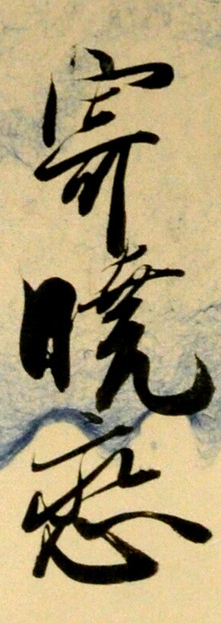寄暁恋
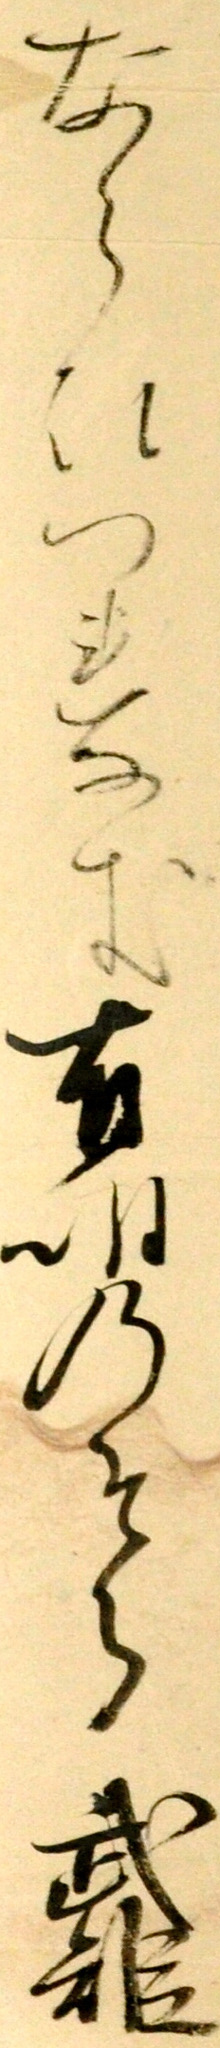ならひつれなき有明のそら武矩

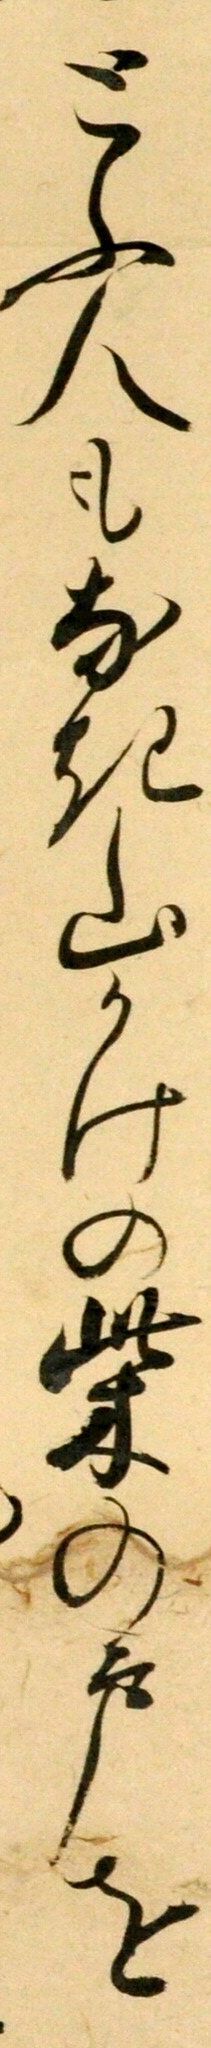とふ人もなき山かけの柴の戸を
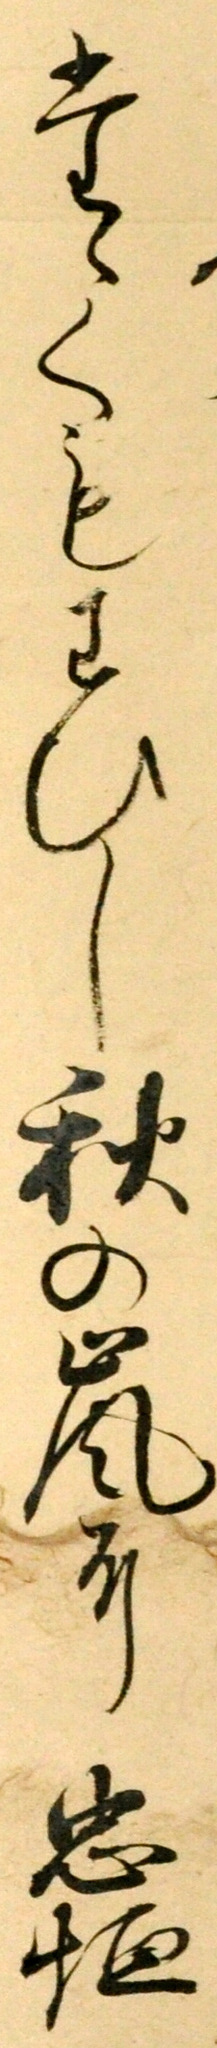たゝくもわひし秋の嵐に忠恒
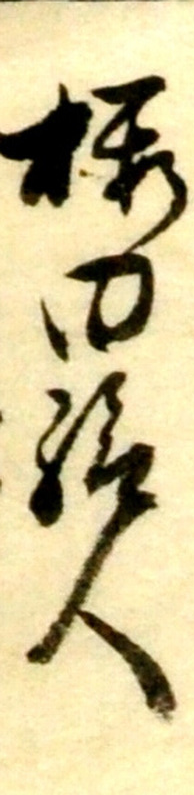桜田給人
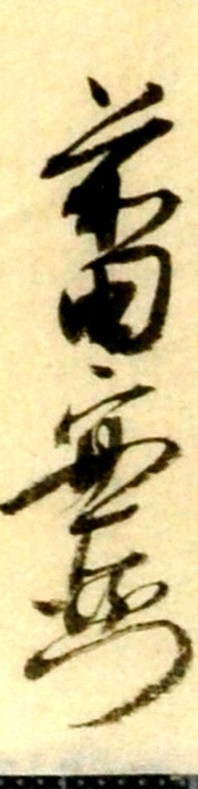前田安左衛門

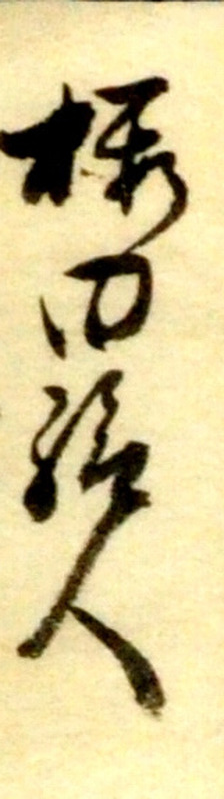桜田給人
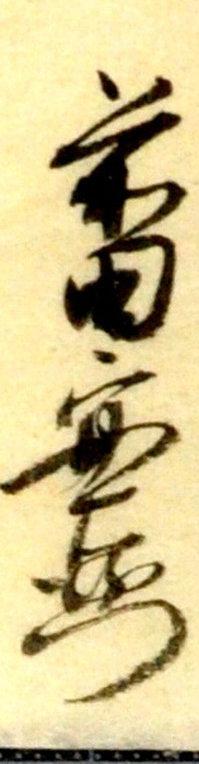前田安左衛門

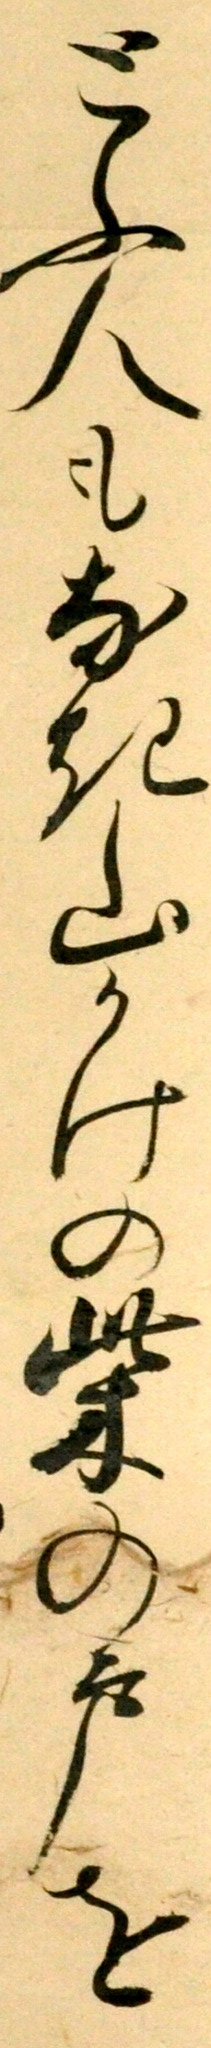とふ人もなき山かけの柴の戸を
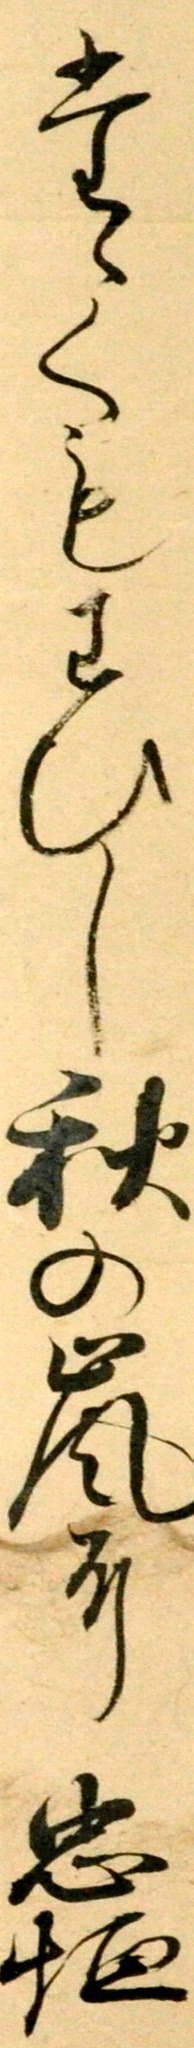たゝくもわひし秋の嵐に忠恒
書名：短冊
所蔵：伊那市立高遠町図書館・合同会社AMANE
